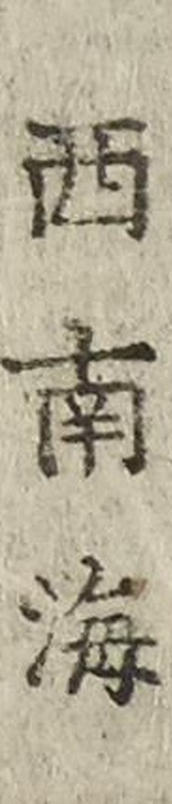西南海
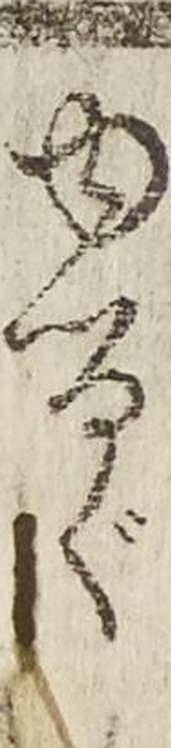ゆるぐ
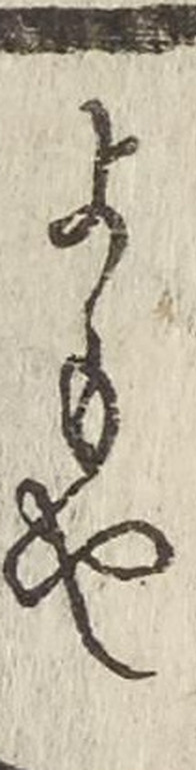よもや
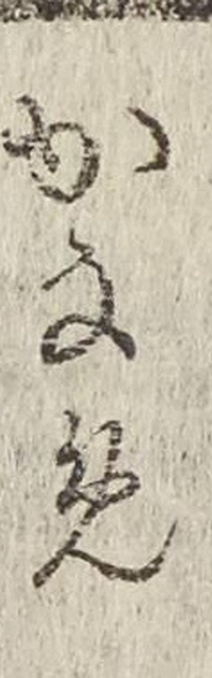かなめ
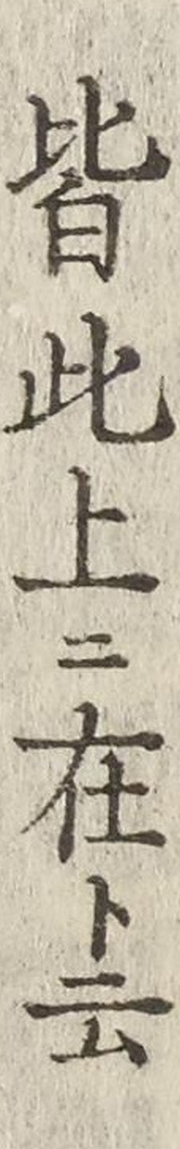皆此上ニ在ト云
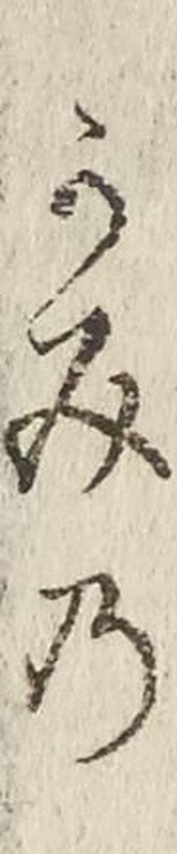うみの
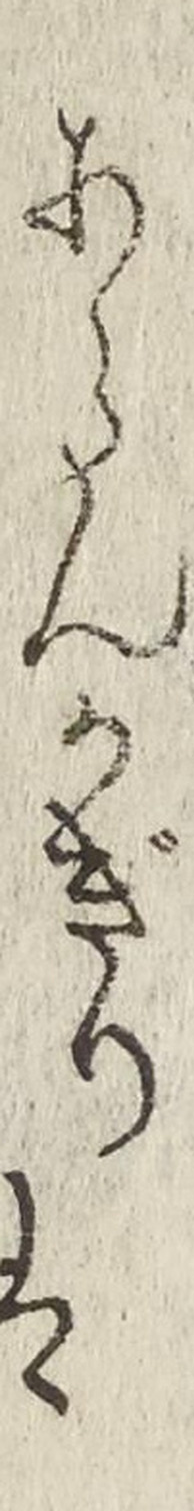あらんかぎりは
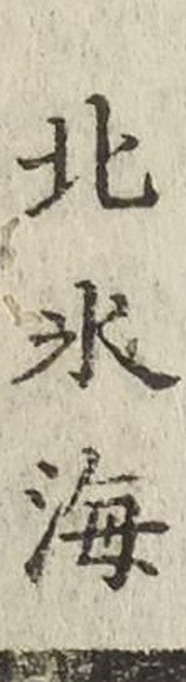北氷海

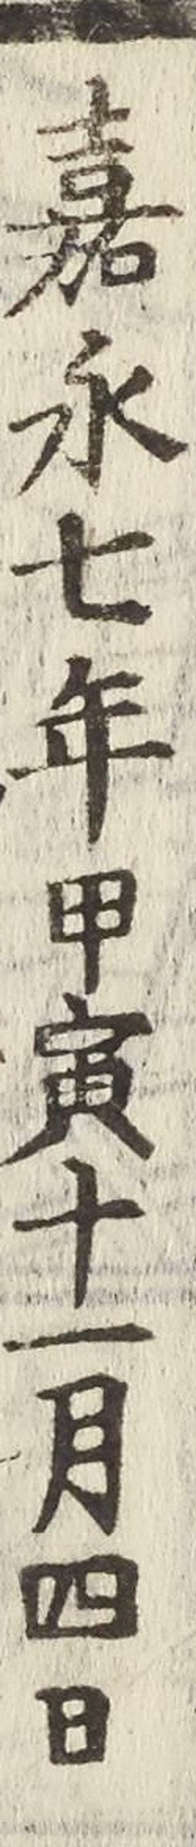嘉永七年甲寅十一月四日
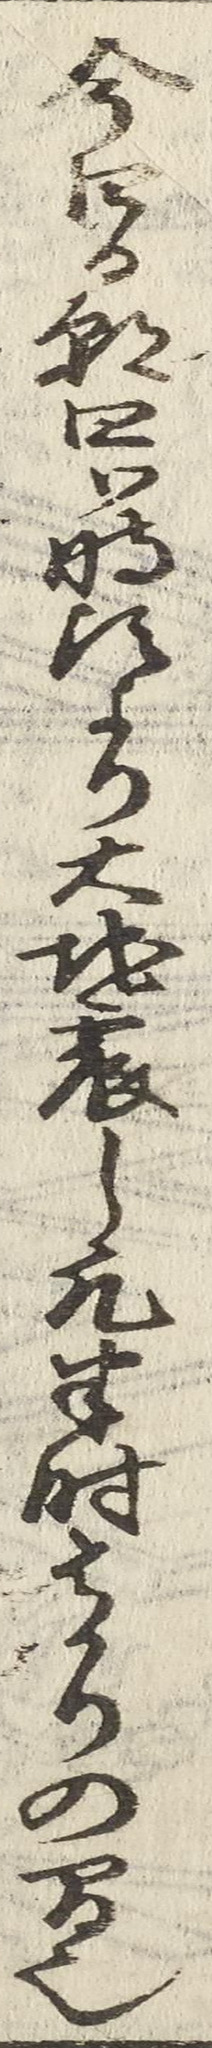今四日朝四ツ時頃より大地震し凡半時はかりの間也

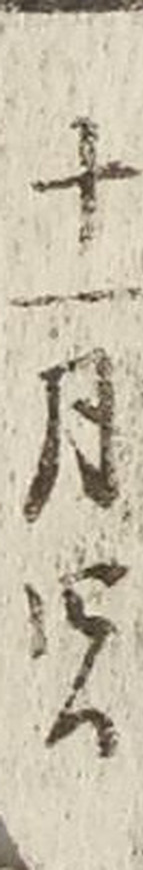十一月四日
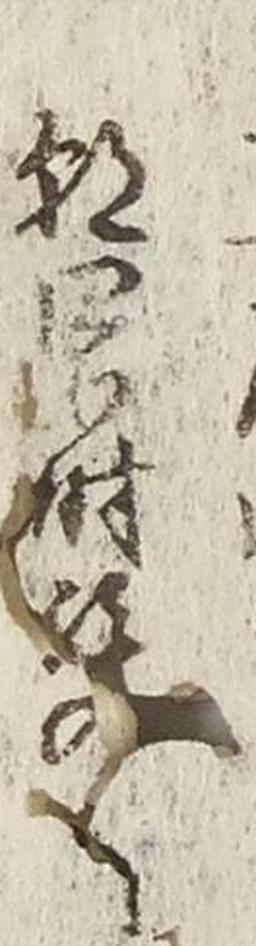朝四ツ時頃の
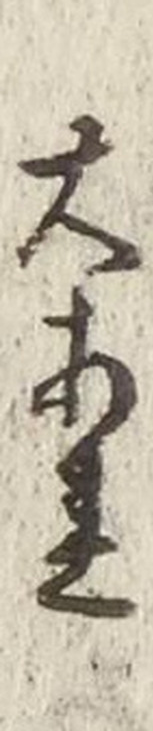大あれ
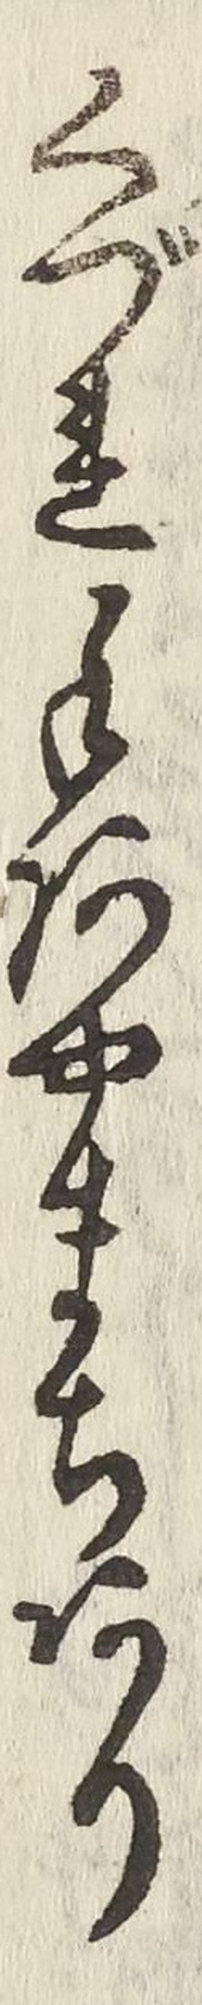くづれ手あやまちあり

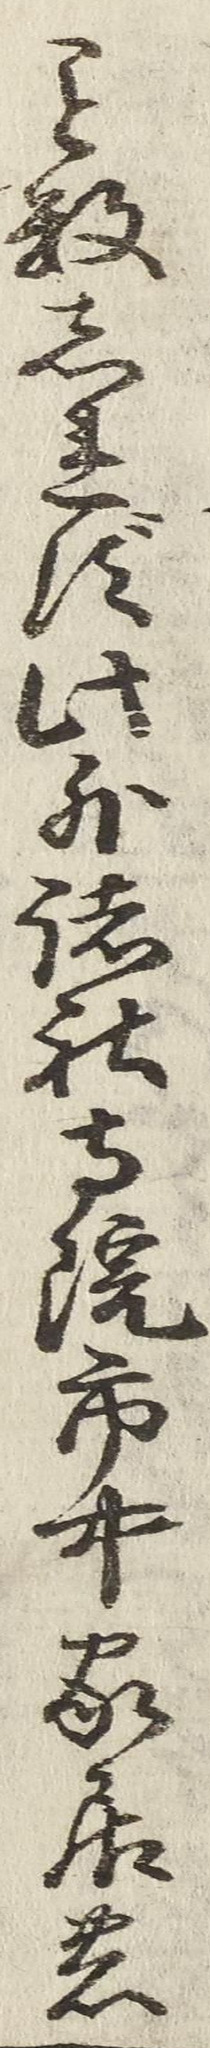こと数しれず此外諸社寺院市中家居の
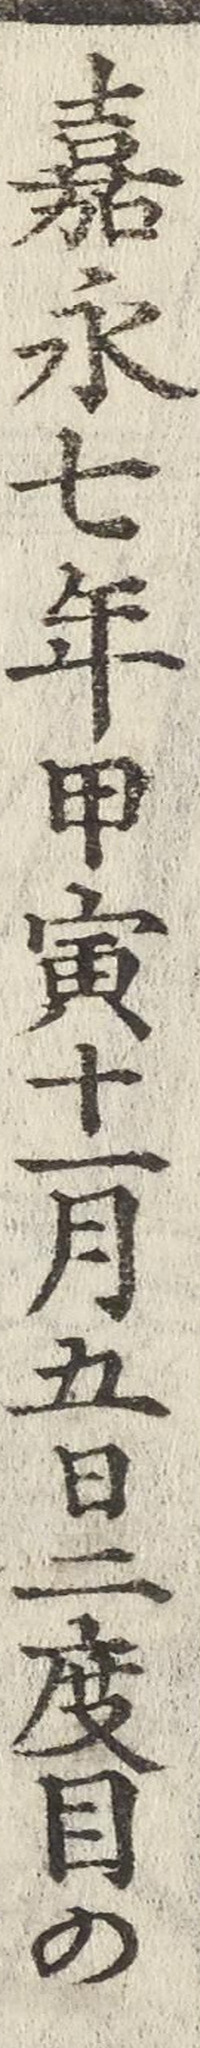嘉永七年甲寅十一月五日二度目の
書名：大地震世直仕艸紙
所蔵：東京大学地震研究所図書室 Earthquake Research Institute Library, The University of Tokyo, JAPAN
